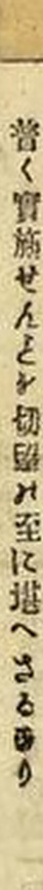普く実施せんことを切望の至に堪へさるなり
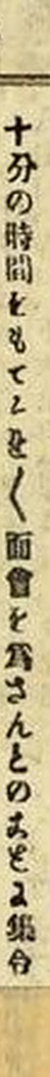十分の時間をもてそれ〳〵面会を為さんとのことに集合
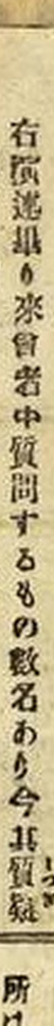右演述畢り来会者中質問するもの数名あり今其質疑
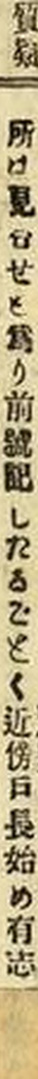所は見合せと為り前号記したるごとく近傍戸長始め有志
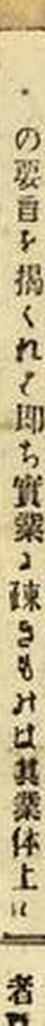の要旨を掲くれは即ち実業に疎きものは其業体上に
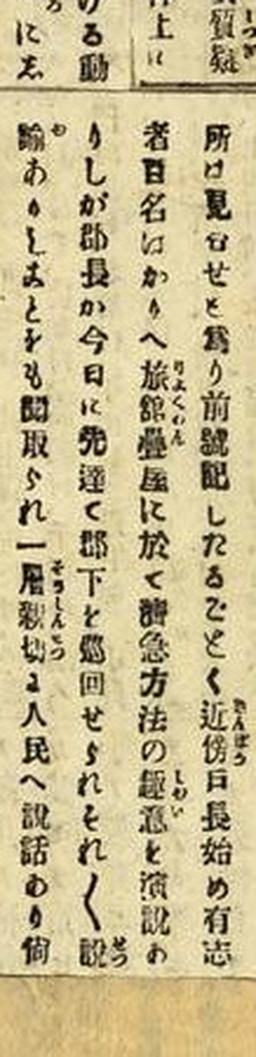者百名はかりへ旅館畳屋に於て済急方法の趣意を演説あ
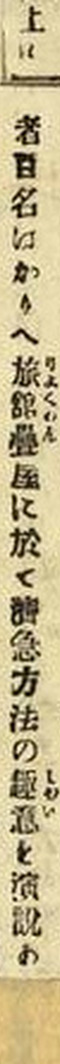者百名はかりへ旅館畳屋に於て済急方法の趣意を演説あ
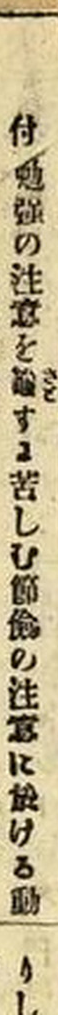付勉強の注意を諭すに苦しむ節倹の注意に於ける動
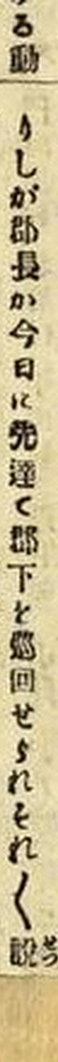りしが郡長か今日に先達て郡下を巡回せられそれ〳〵説
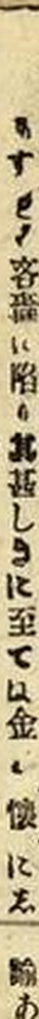もすれは吝嗇に陥り其甚しきに至ては金を懐にし
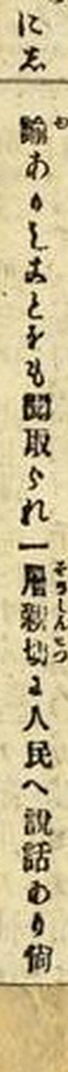諭ありしことをも聞取られ一層親切に人民へ説話あり尚
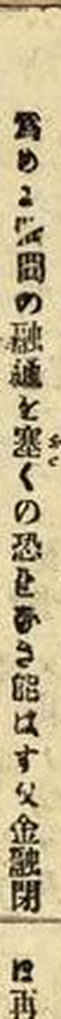為めに質問の融通を塞くの恐れなき能はす又金融閉
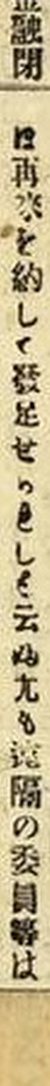ほ再来を約して発足せられしと云ふ尤も遠隔の委員等は
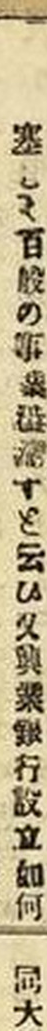塞して百般の事業渋滞すと云ひ又興業銀行設立如何
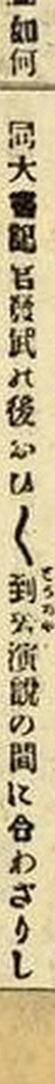同大書記官発武の後おひ〳〵到着演説の間に合わざりし
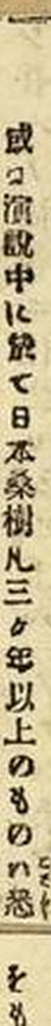或は演説中に於て日本桑樹凡三ケ年以上のものは悉
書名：温古集 五巻
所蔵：福井県文書館 Fukui Prefectural Archives
